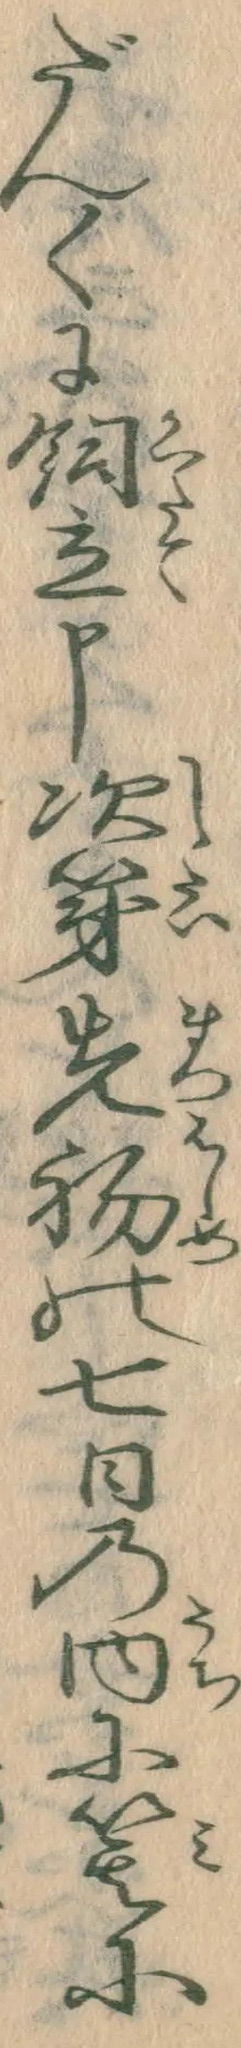だん〳〵に飼立申次第先初の七日の内に箕に
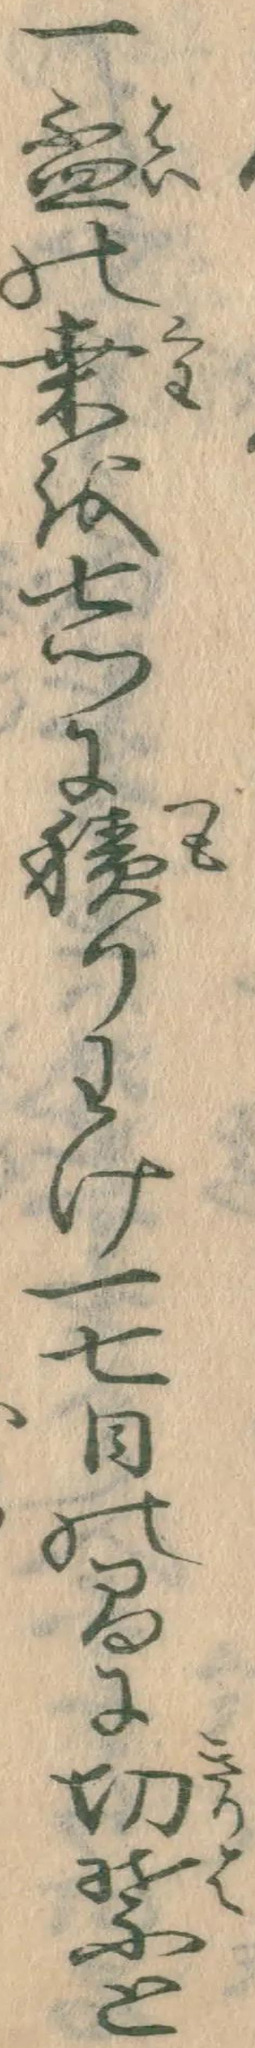一盃の桑を七つに積りわけ一七日の間に切葉と
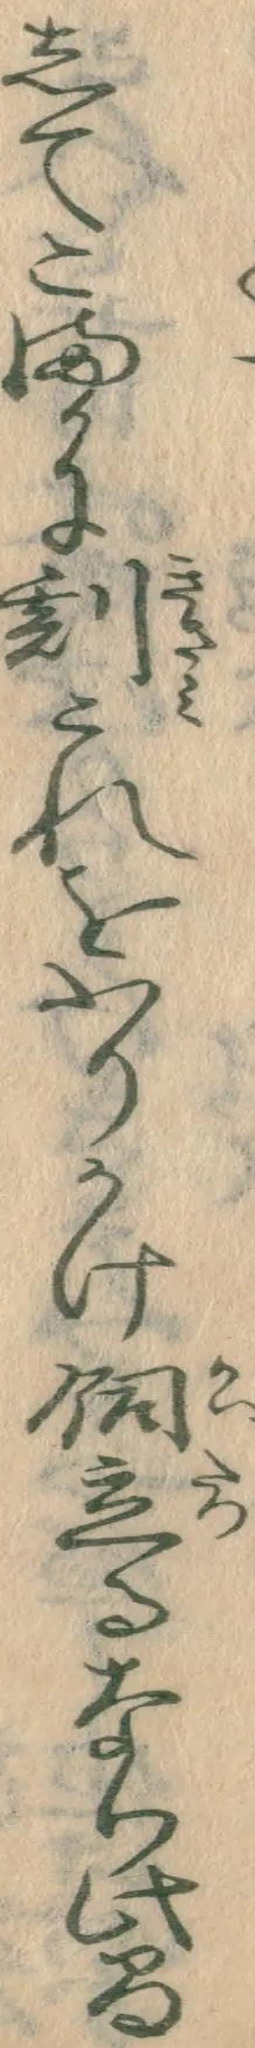してこまかに刻これをふりかけ飼立るなり此間
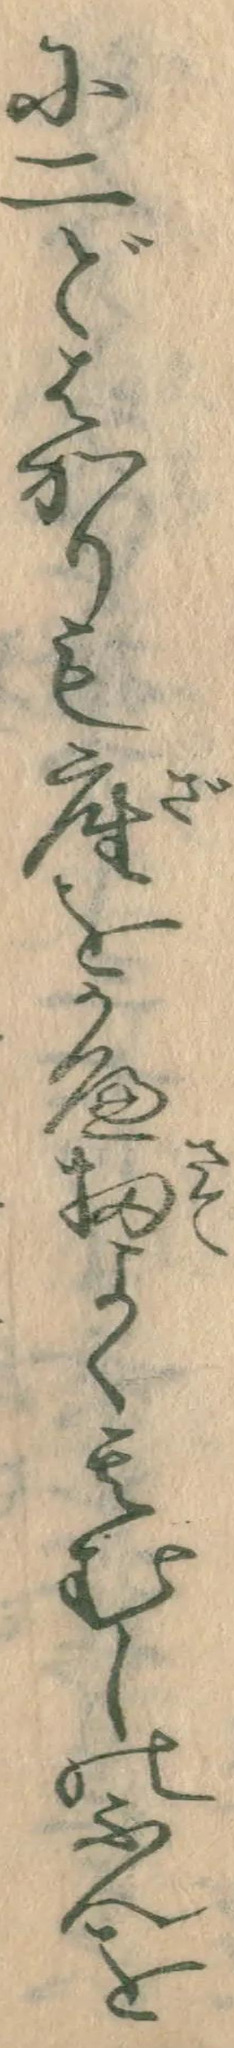に二どはかりも座をかへ扨よく其むしのふんを
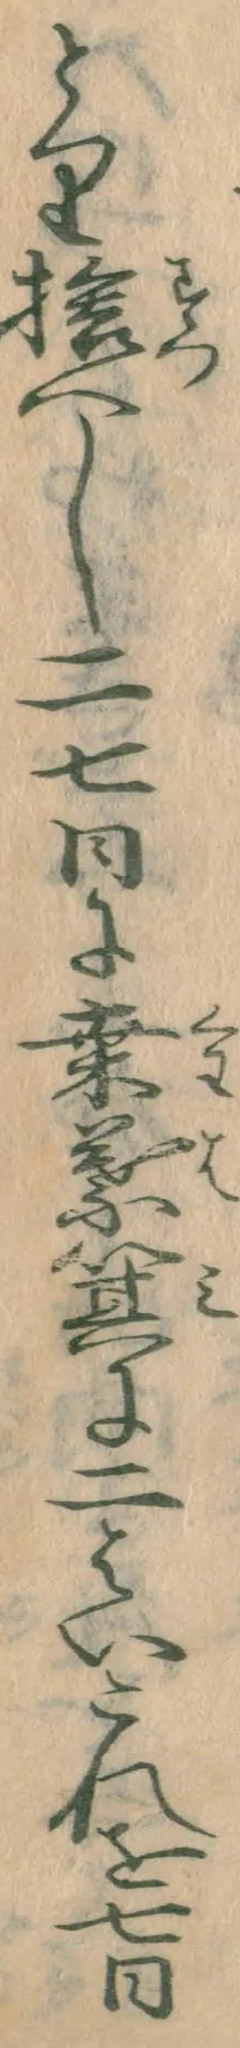とり捨へし二七日に桑葉箕に二はいこれを七日

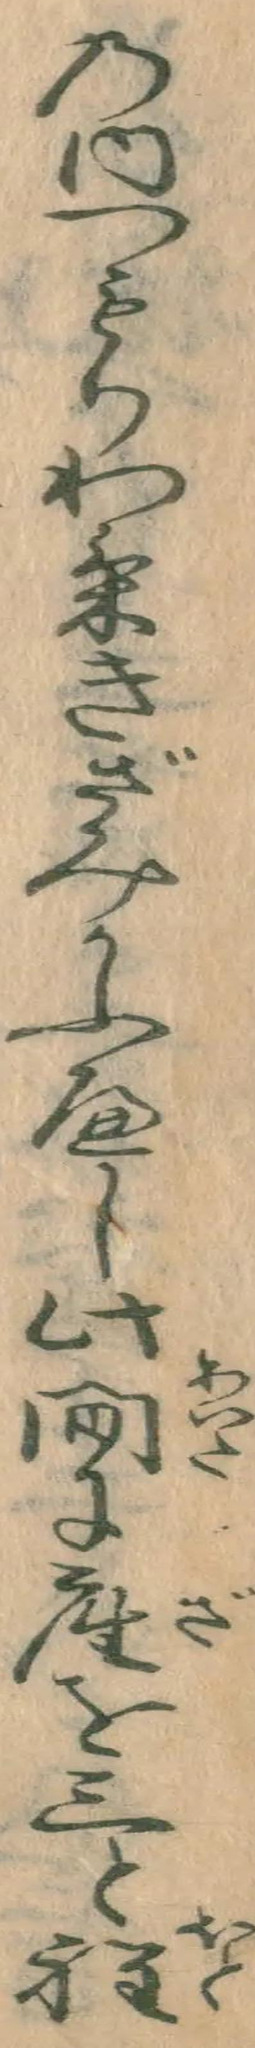の内つもりわけきざみかふへし此間に座を三と程
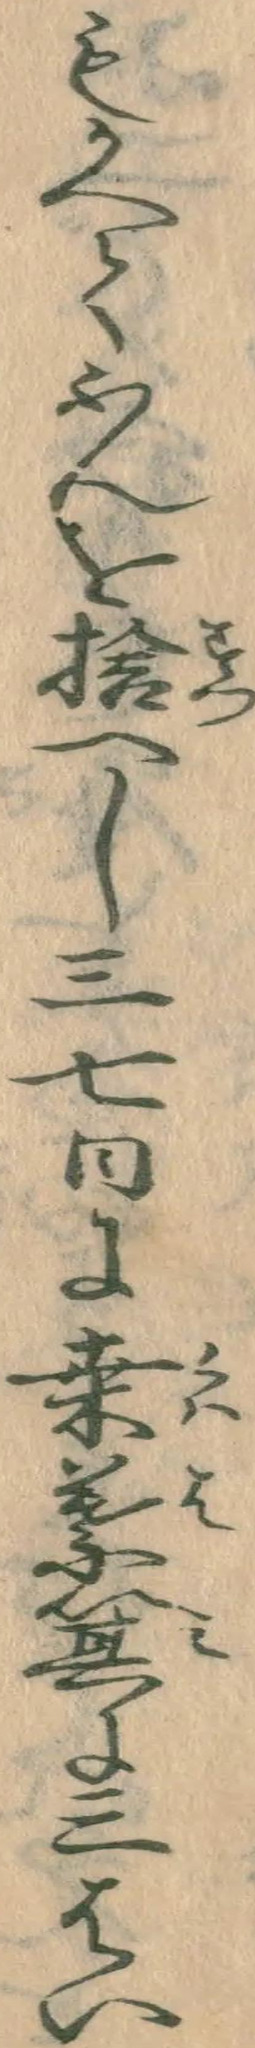もかへてふんを捨へし三七日に桑葉箕に三はい
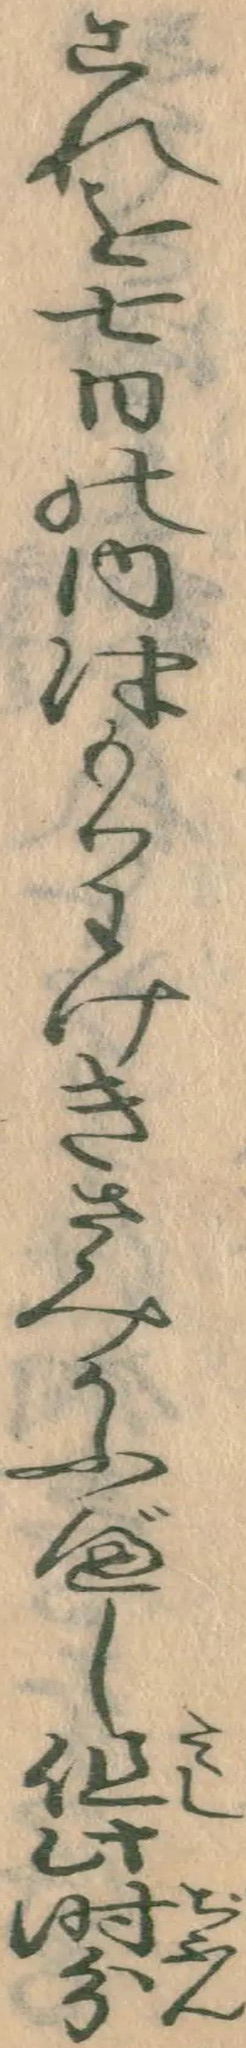これを七日の内つもりわけきさみかふべし但此時分
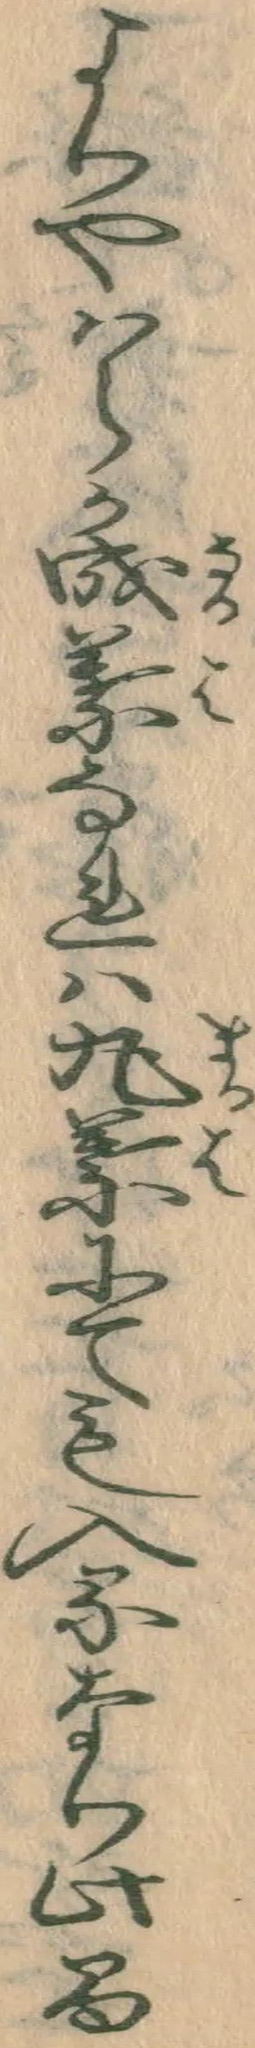よりやはらか成葉なれは丸葉にても入るなり此間
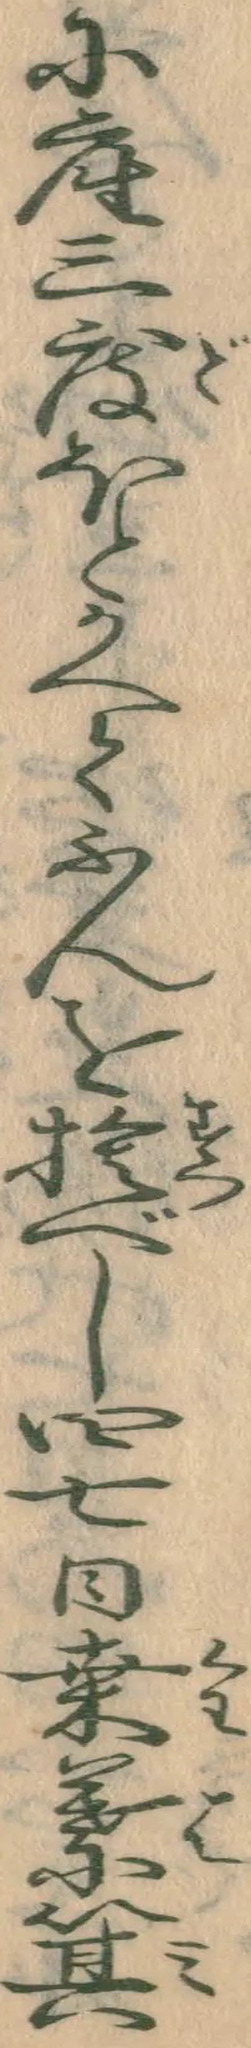に座三度ほとかへてふんを捨べし四七日桑葉箕
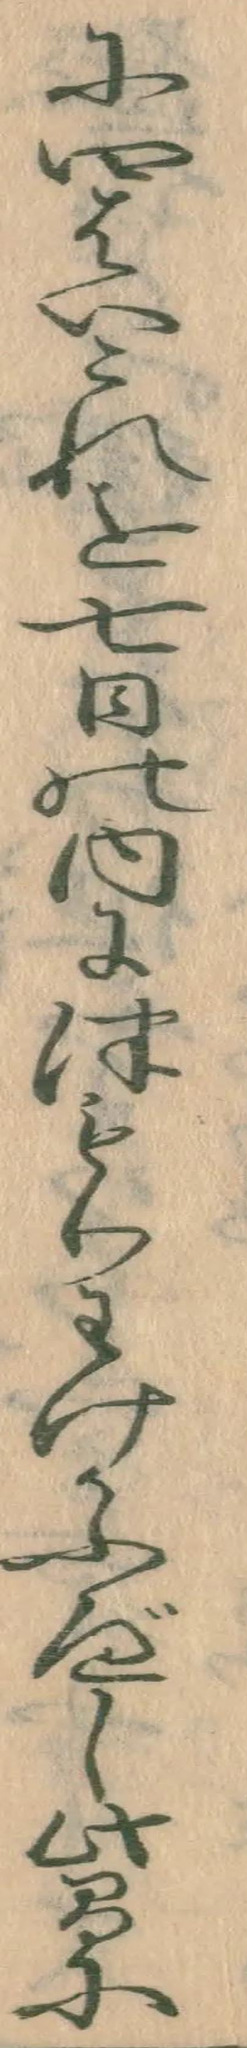に四はいこれを七日の内につもりわけかふべし此間に
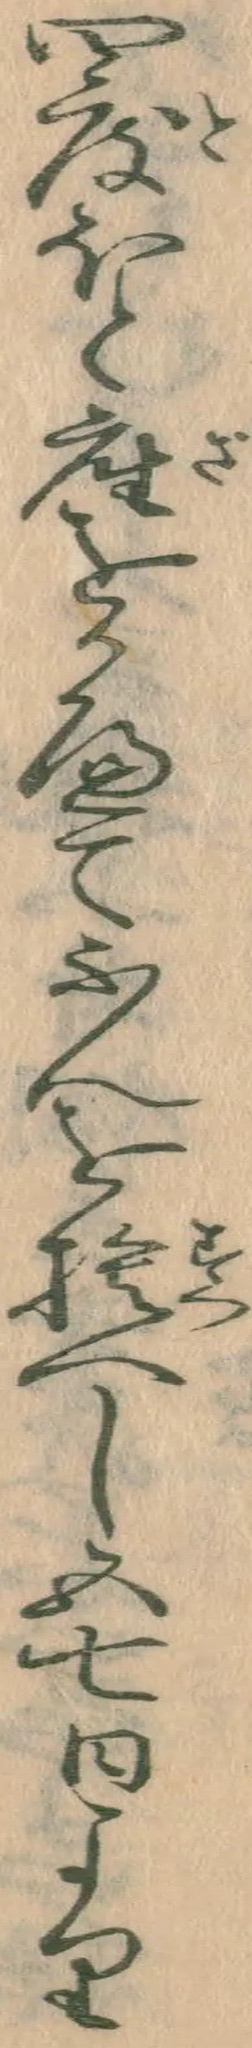四度ほと座をかへてふんを捨へし五七日より
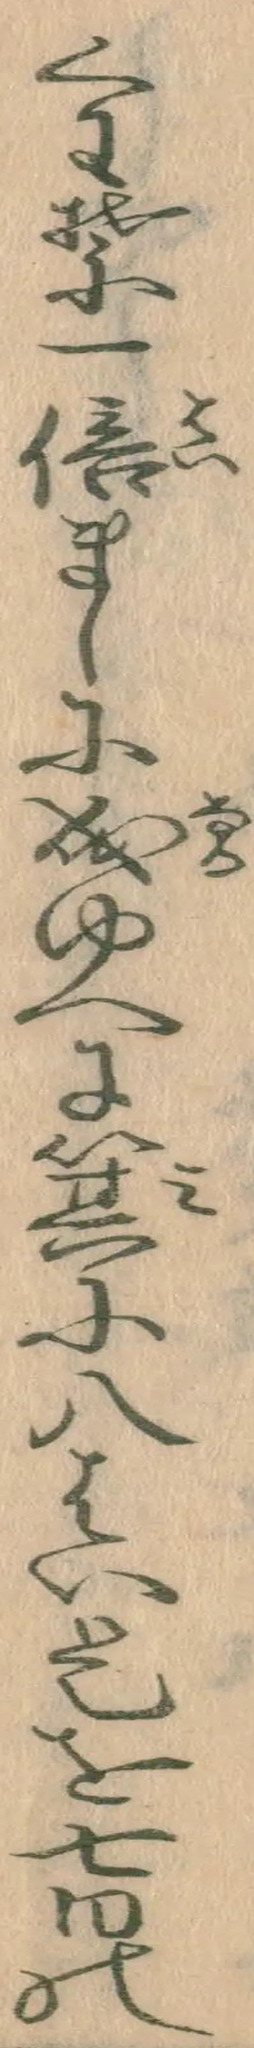くわ葉一倍ましに成ゆへに箕に八はい是を七日の
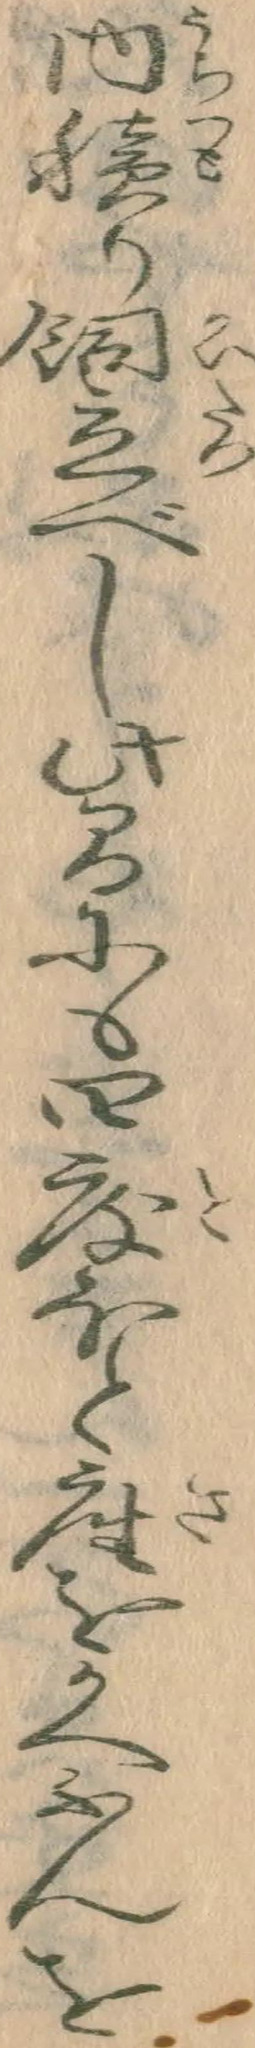内積り飼立べし此間にも四度ほと座をかへふんを
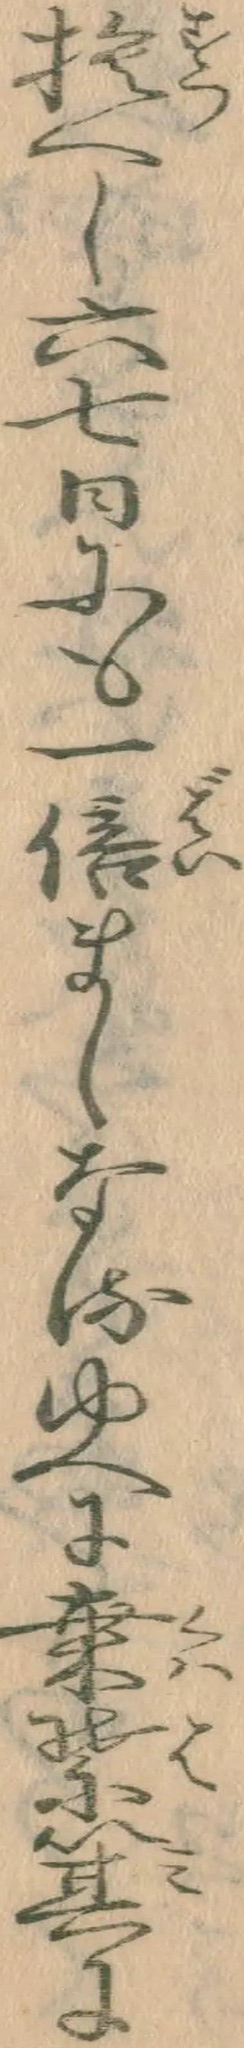捨へし六七日にも一倍ましなるゆへに桑葉箕に
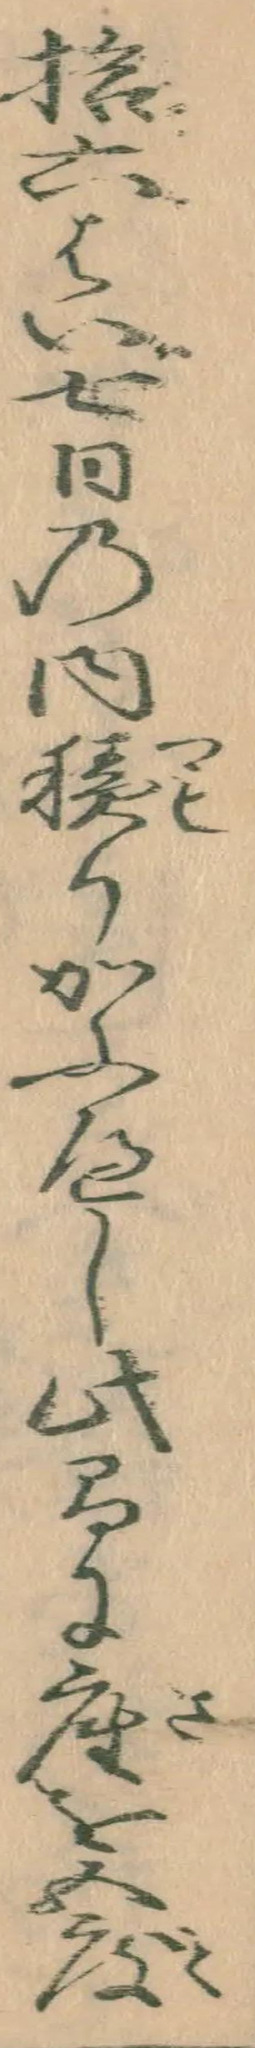拾六はい七日の内積りかふへし此間に座を五度
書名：蚕飼養法記
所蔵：国立国会図書館 National Diet Library, JAPAN
